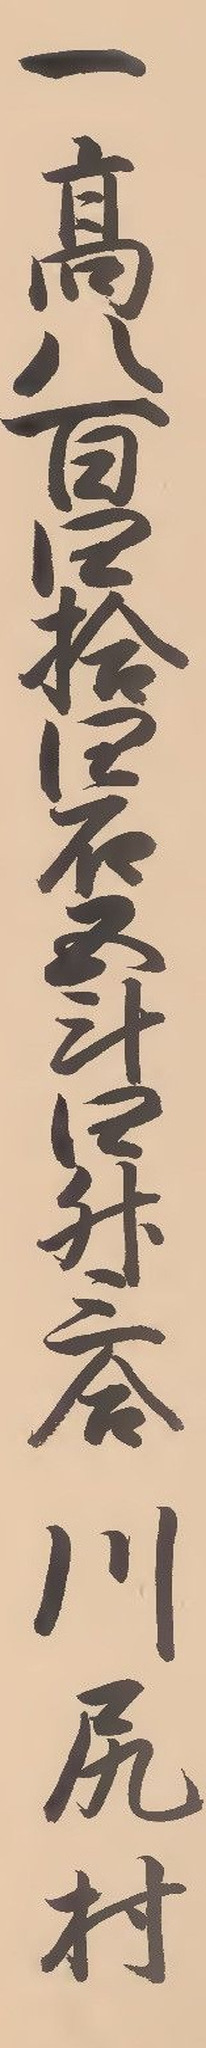一高八百四拾四石五斗四升三合川尻村
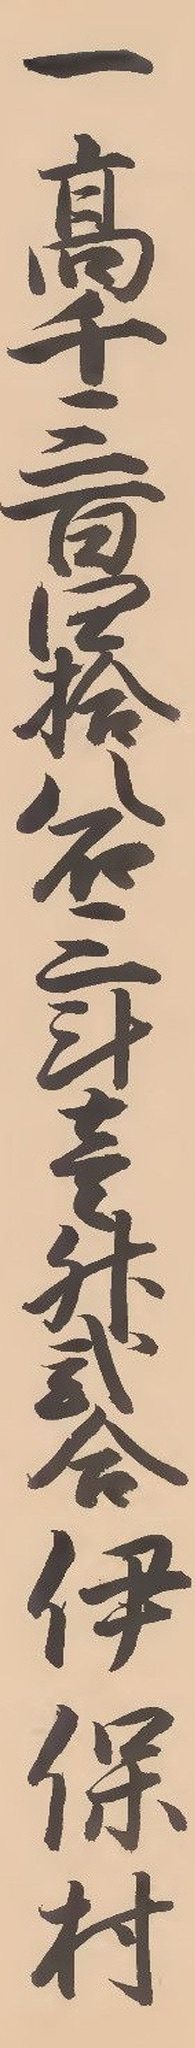一高千三百四拾八石三斗壱升弐合伊保村
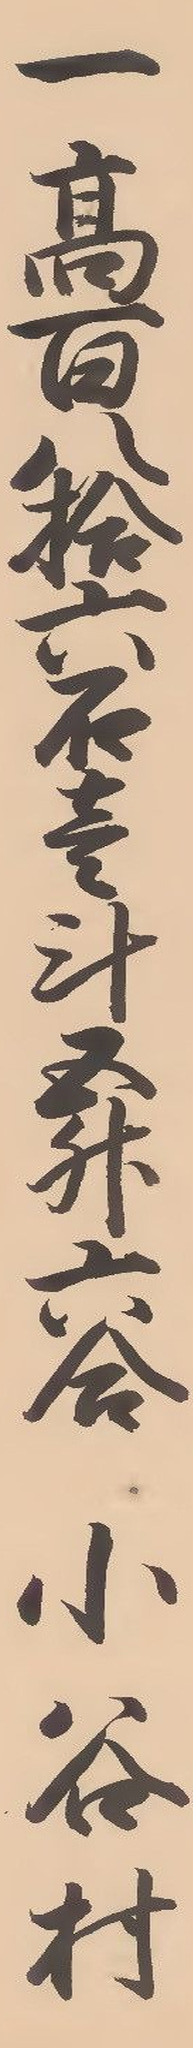一高百八拾六石壱斗五升六合小谷村
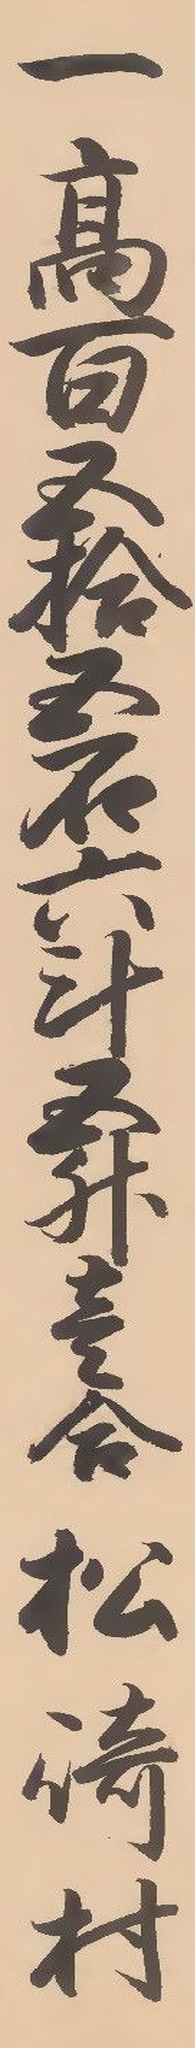一高百五拾五石六斗五升壱合松崎村

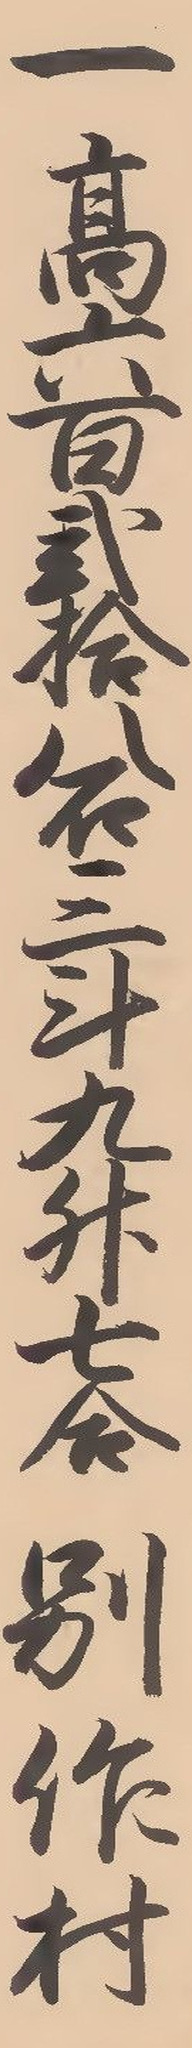一高六百弐拾八石三斗九升七合別作村
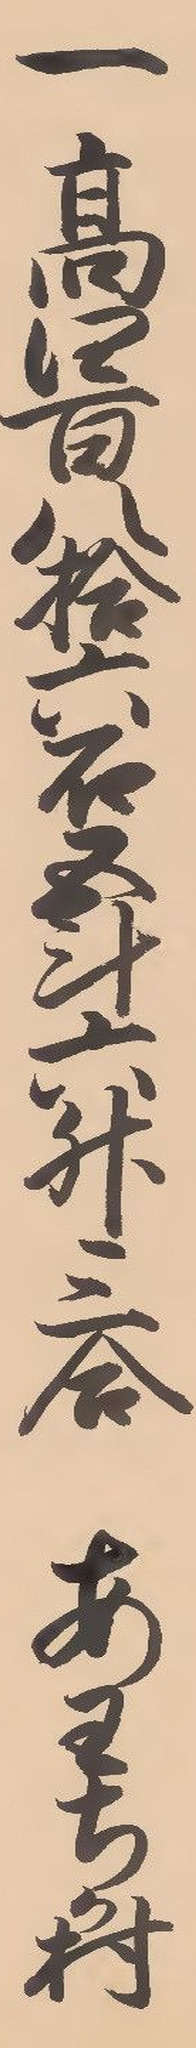一高四百八拾六石五斗六升三合あわちか村
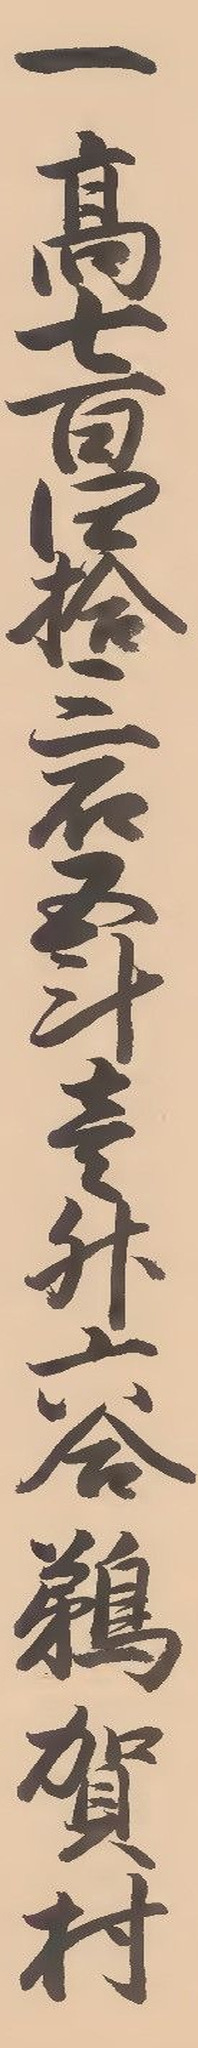一高七百四拾三石五斗壱升六合鵜賀村
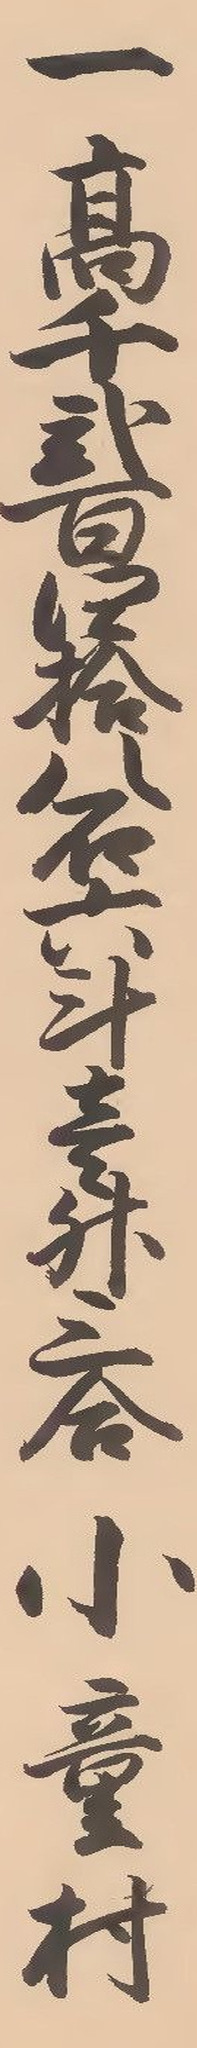一高千弐百四拾八石六斗壱升三合小童村
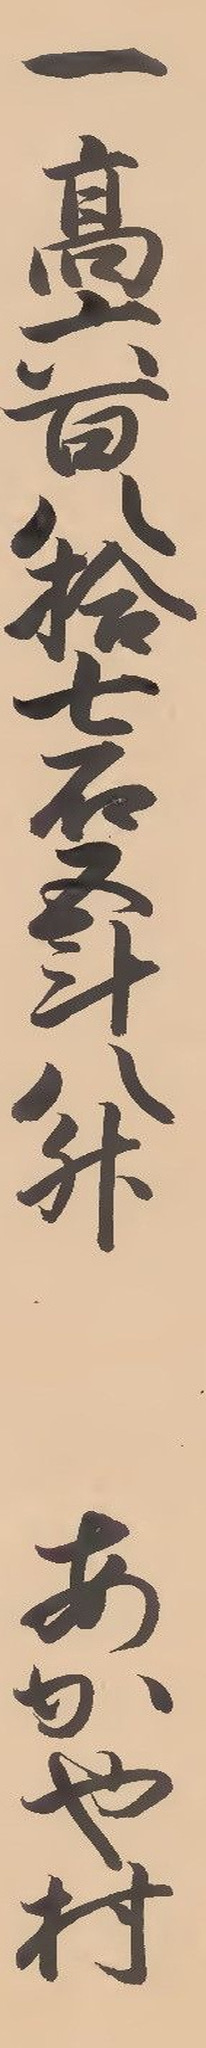一高六百八拾七石五斗八升あかや村
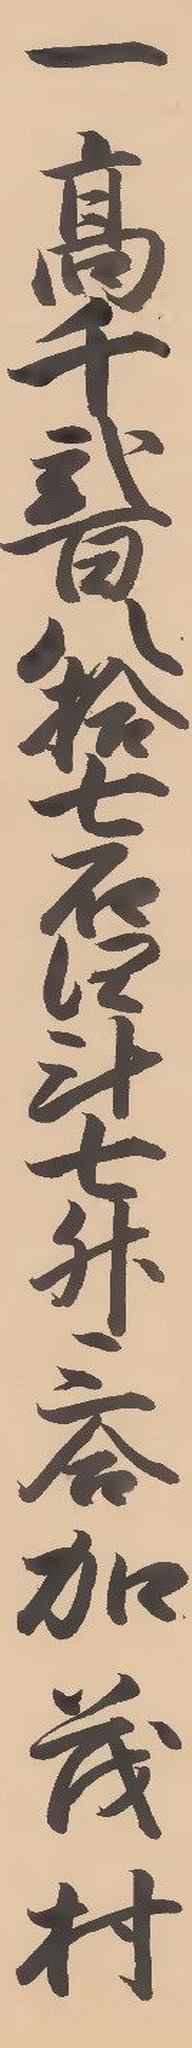一高千弐百八拾七石四斗七升三合加茂村
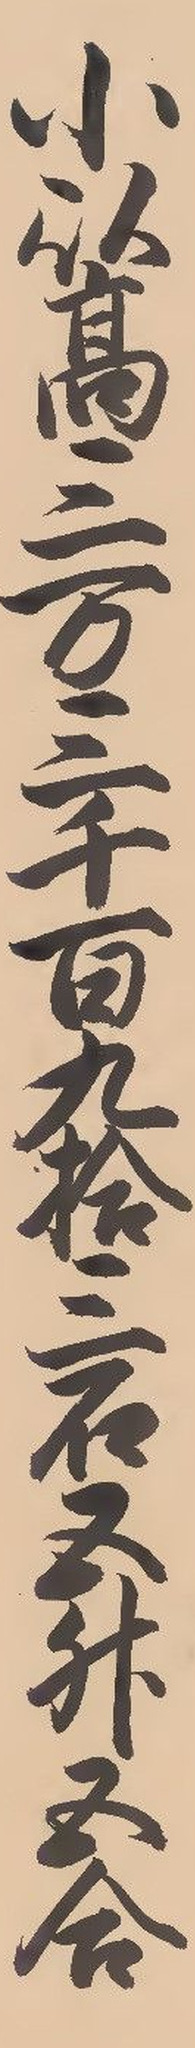小以高三万三千百九拾三石五升五合

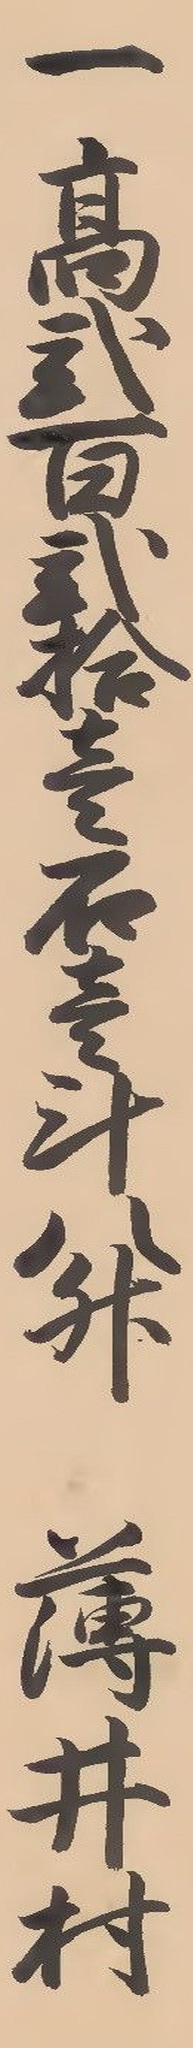一高弐百弐拾壱石壱斗八升薄井村
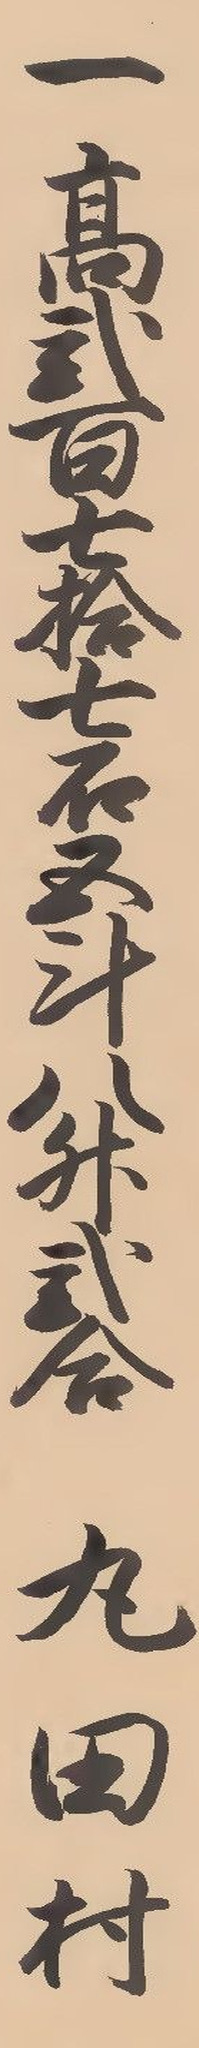一高弐百七拾七石五斗八升弐合丸田村
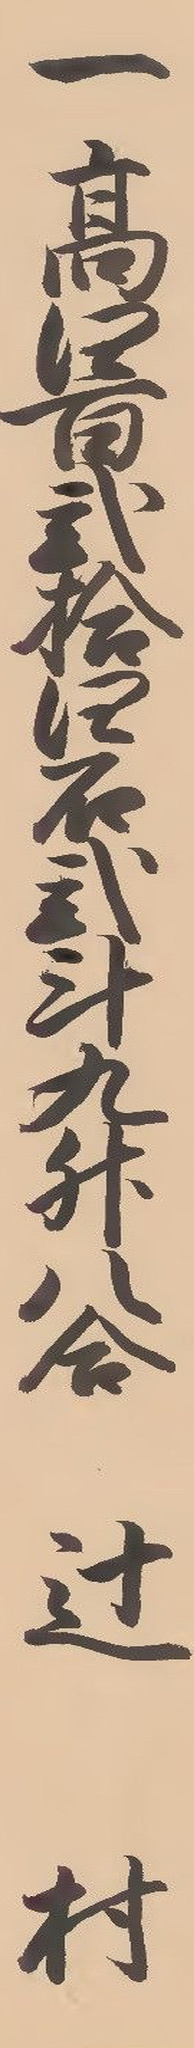一高四百弐拾四石弐斗九升八合辻村
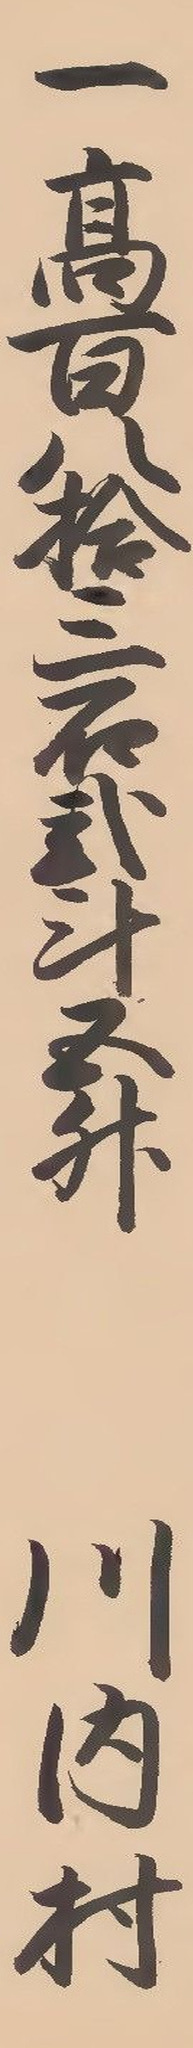一高百八拾三石弐斗五升川内村
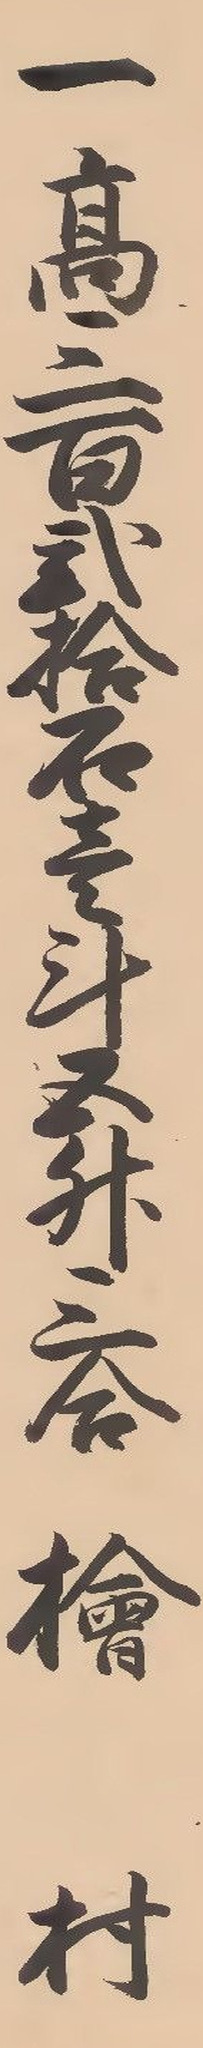一高三百弐拾石壱斗五升三合桧村
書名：備後国郷帳
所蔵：国立公文書館 National Archives of Japan
